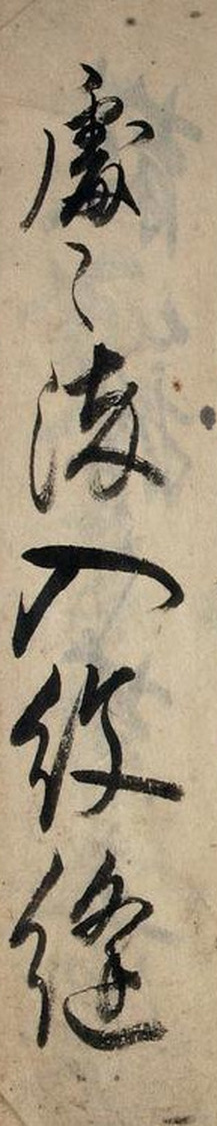処々染入紋縫

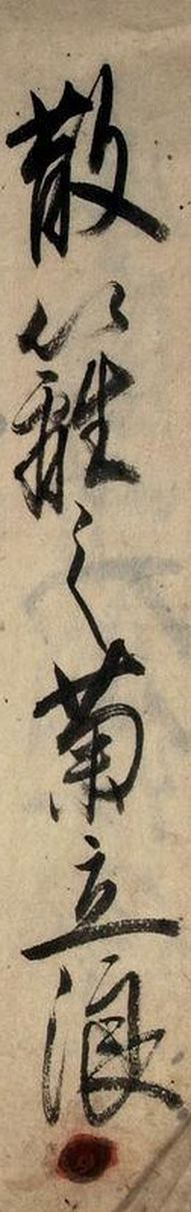散籬之菊立浪
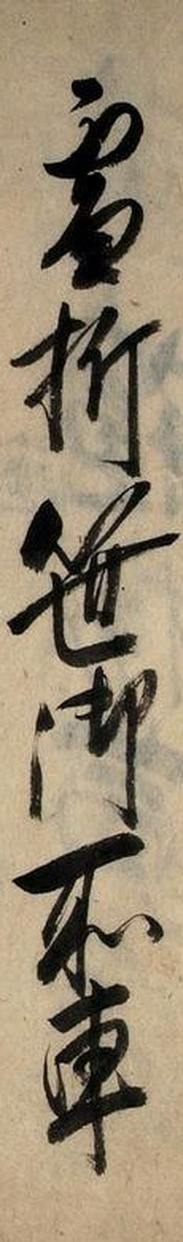雪折笹御所車
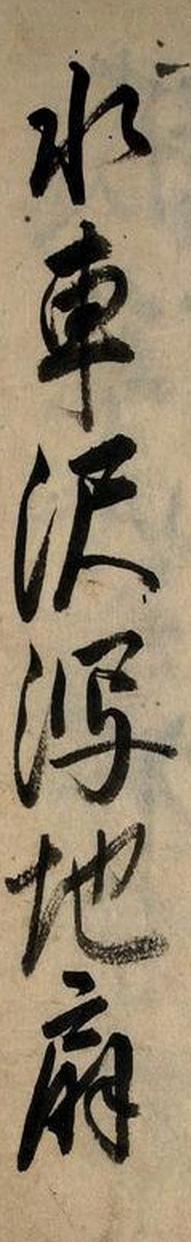水車沢瀉地扇
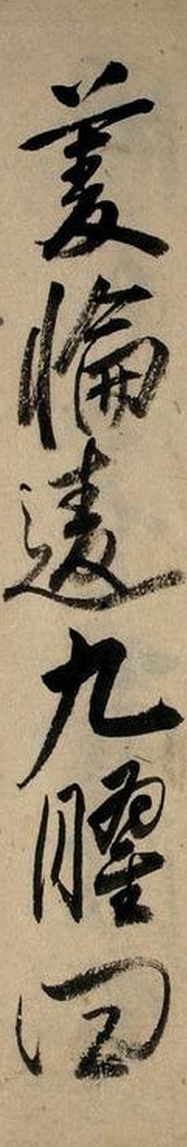菱輪違九曜四
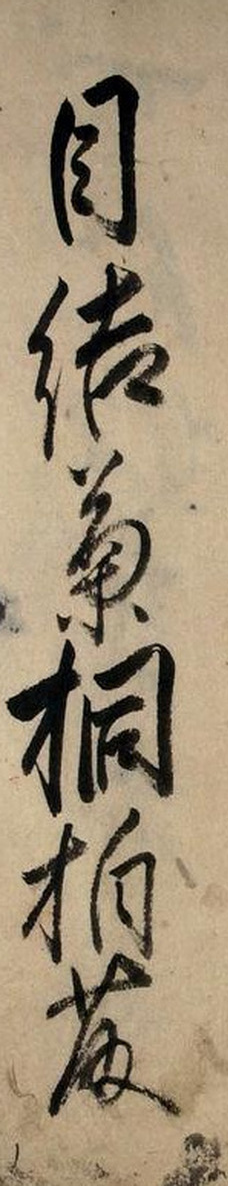目結菊桐柏藤
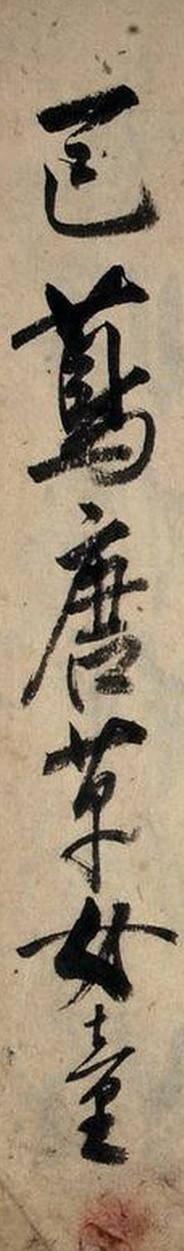巴蔦唐草女童

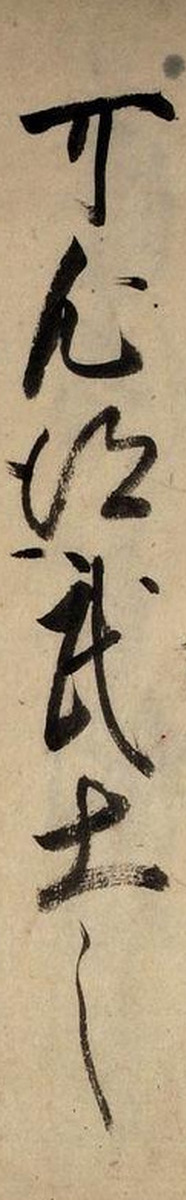可心得武士之
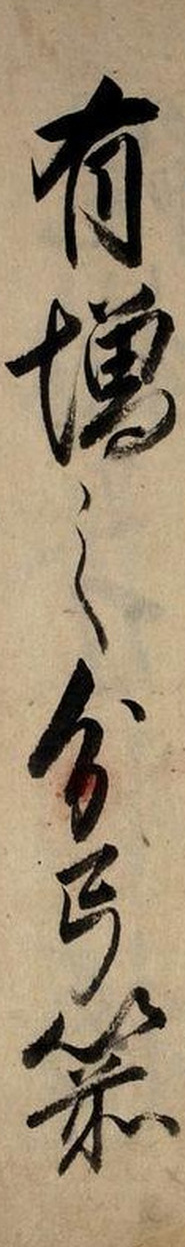有増之分弓箭
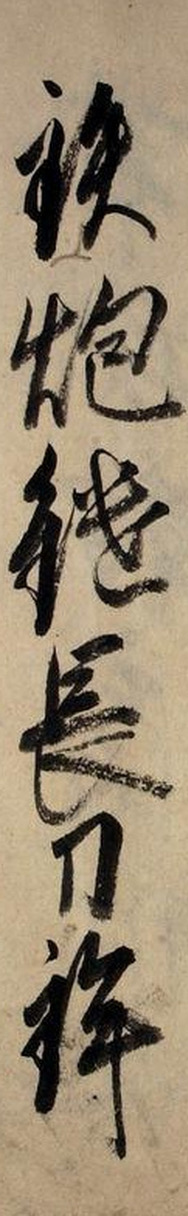鉄砲継長刀鉾
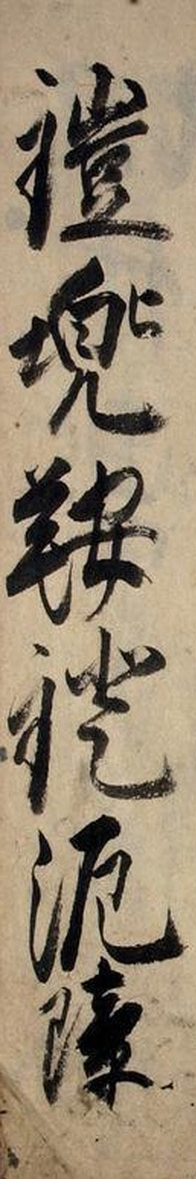鎧兜鞍鐙泥障

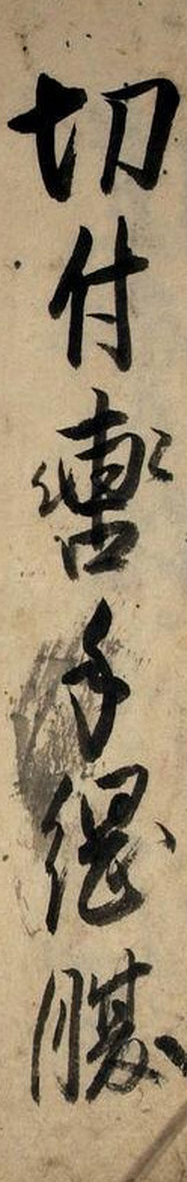切付轡手綱腹
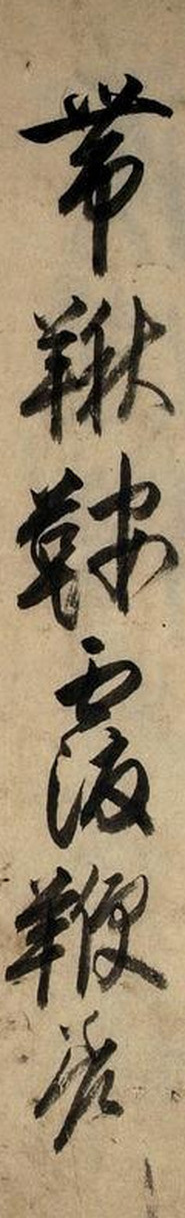帯鞦鞍覆鞭差
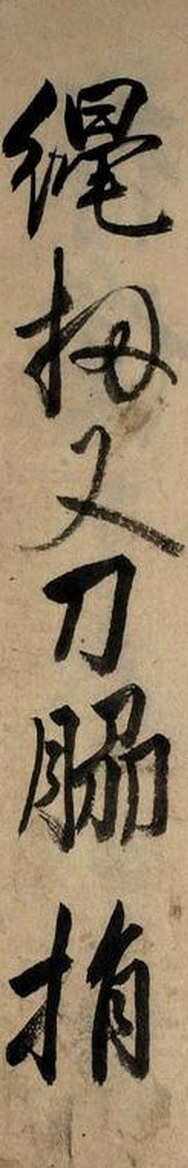縄扨又刀脇指
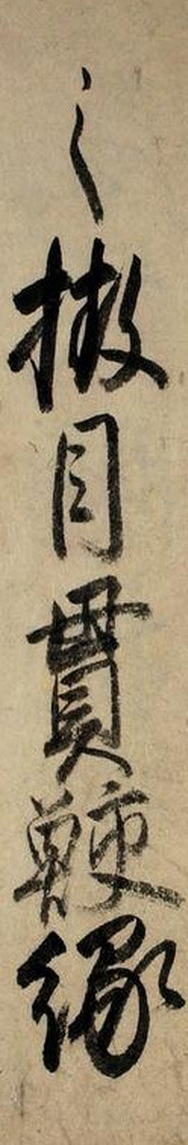之拵目貫鮫縁
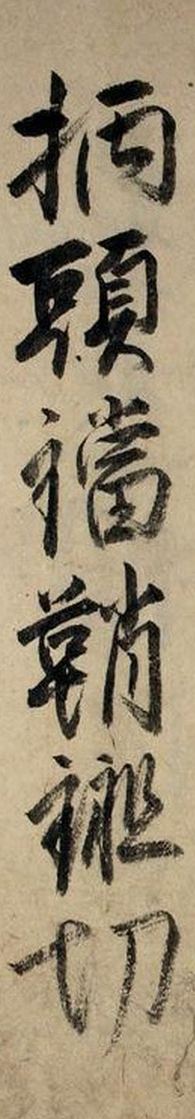柄頭鐺鞘鎺切
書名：商売往来（往来物、手習手本）
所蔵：福井県文書館 Fukui Prefectural Archives
